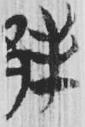邦
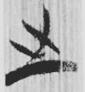之
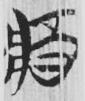𨟻（將）
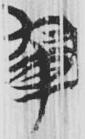軍（軍）
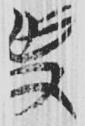拃（作）
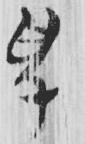色
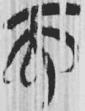而
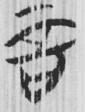言
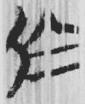於
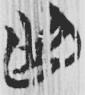廷
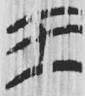王
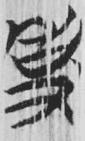事
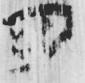可（何）
